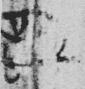訐
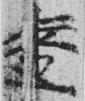○（來）
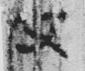反
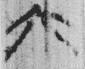六
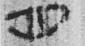四
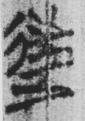○（往）
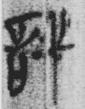訐
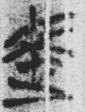○（來）
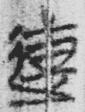連
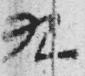九
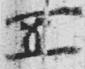五
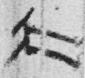大
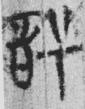訐
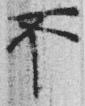不
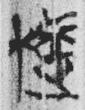○（來）
